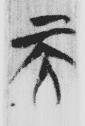天
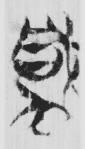風
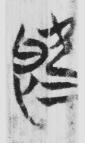既
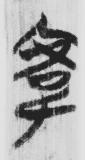{宀韋}
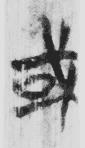或
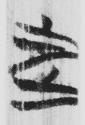{之止}
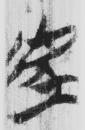𫊟
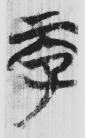{亓子}
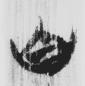自
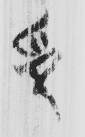印
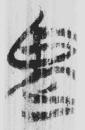畏
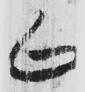㠯（以）
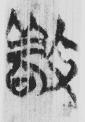敬
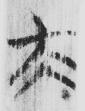夫
